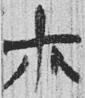尓（邇）
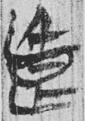良
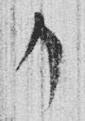人
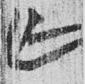亡
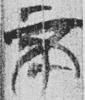不
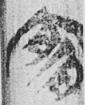宜
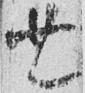也
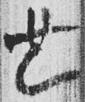也
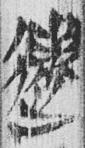遺
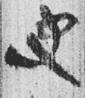夬（玦）
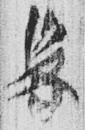峉（徵）
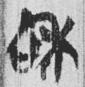和
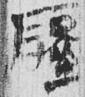廛（輾）
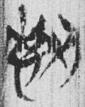○（轉）
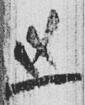之
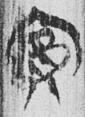實
